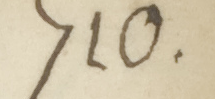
710.
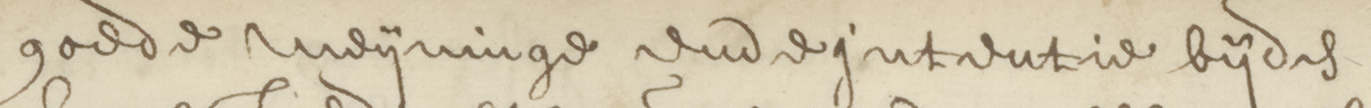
goede meijninge ende intentie bijden
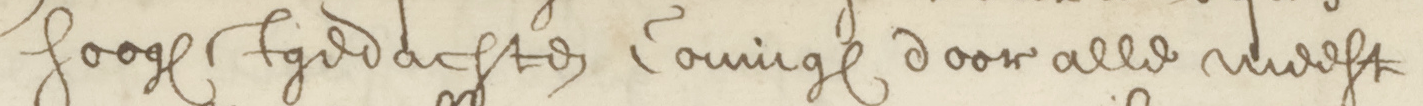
hooghstgedachten Coningh door alle meest
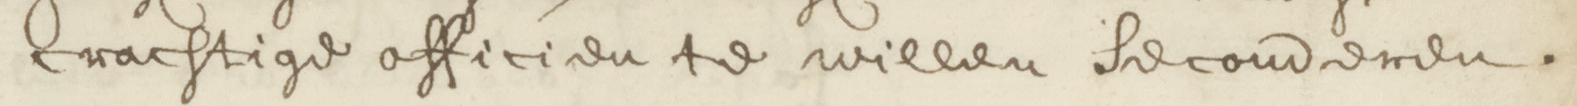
crachtige officien te willen seconderen.
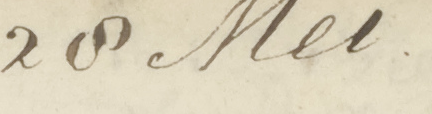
28 Mei.
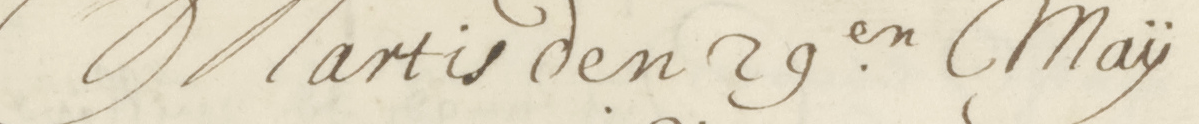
Martis den 29en. Maij
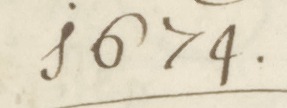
1674.
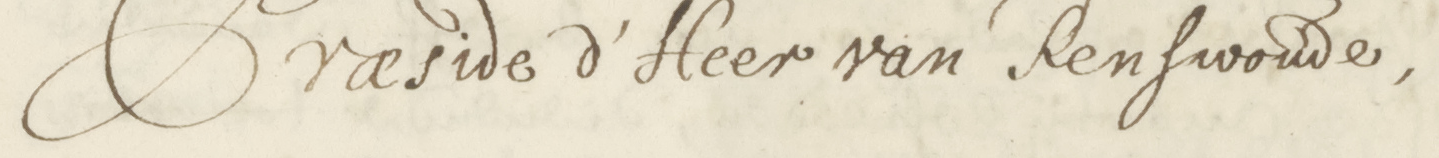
Præside d'Heer van Renswoude,
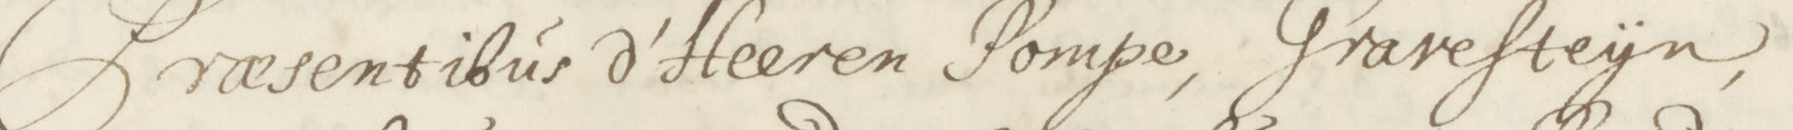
Præsentibus d'Heeren Pompe, Gravesteijn,
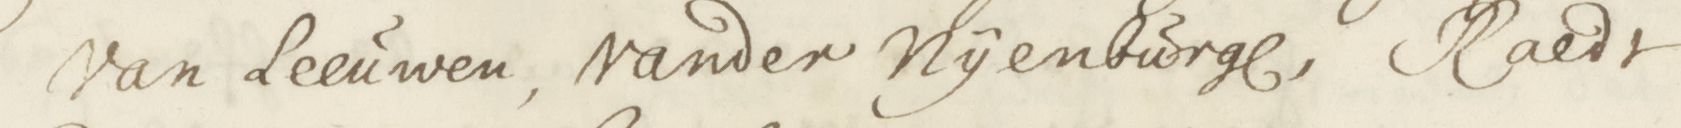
van Leeuwen, vander Nijenburgh, Raedt
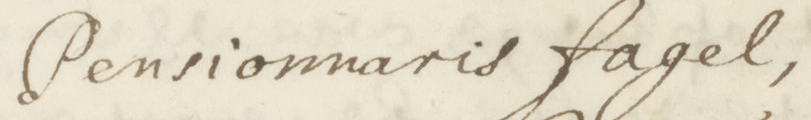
Pensionnaris Fagel,
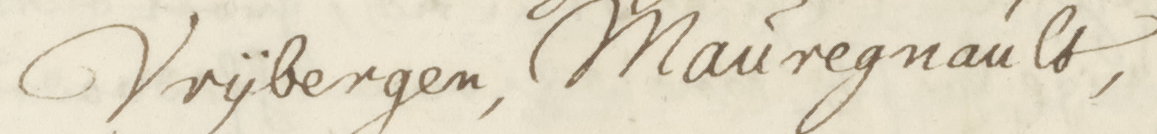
Vrijbergen, Mauregnault,
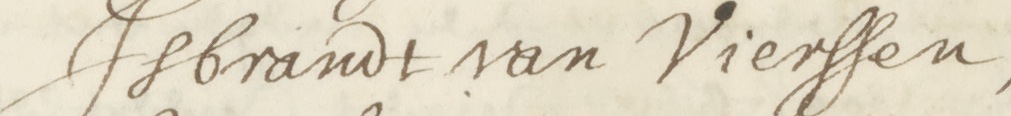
Isbrandt van Vierssen,
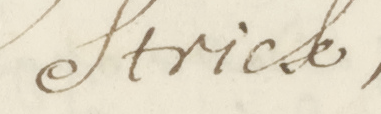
Strick,
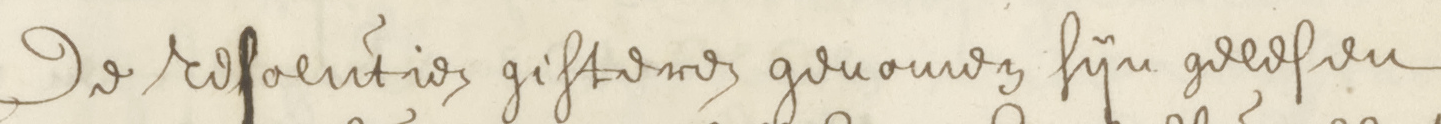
De resolutien gisteren genomen sijn gelesen
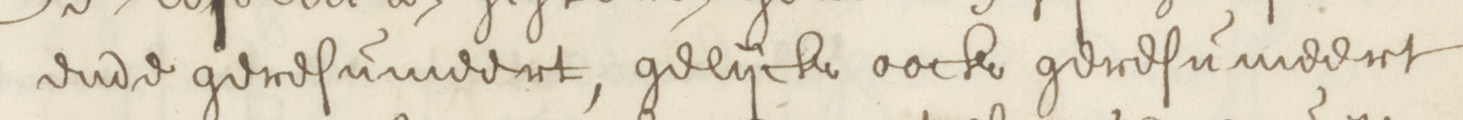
ende geresumeert, gelijck oock geresumeert
